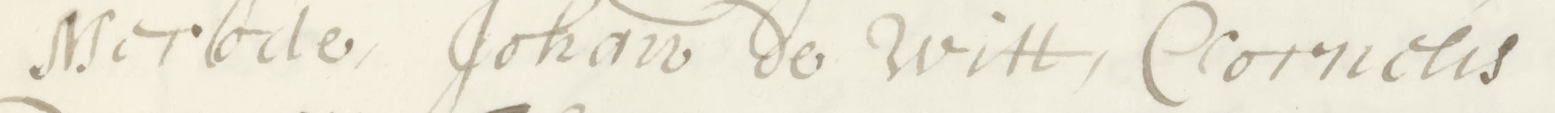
Merode, Johan de Witt, Cornelis
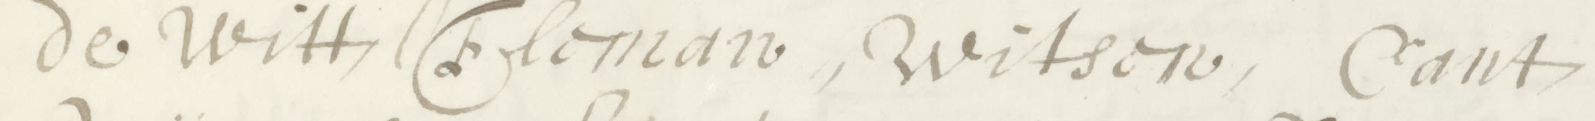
de Witt, Eleman, Witsen, Cant,
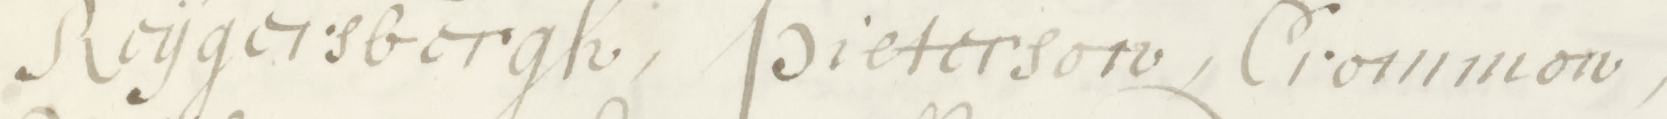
Reijgersbergh, Pieterson, Crommon,
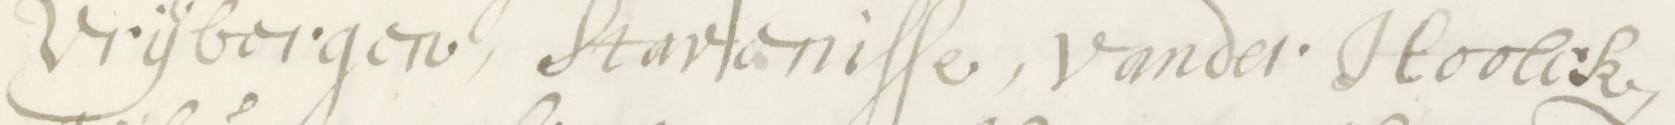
Vrijbergen, Stavenisse, vander Hoolck,
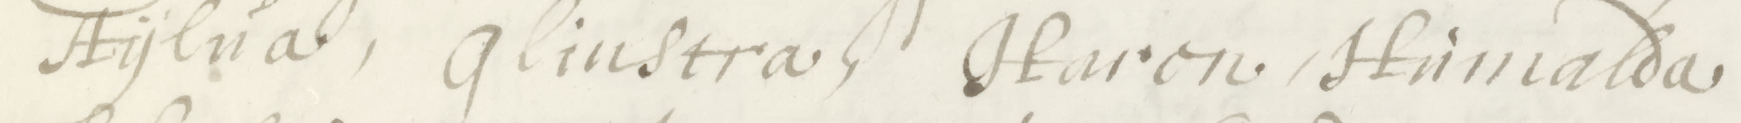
Aijlua, Glinstra, Haren, Humalda
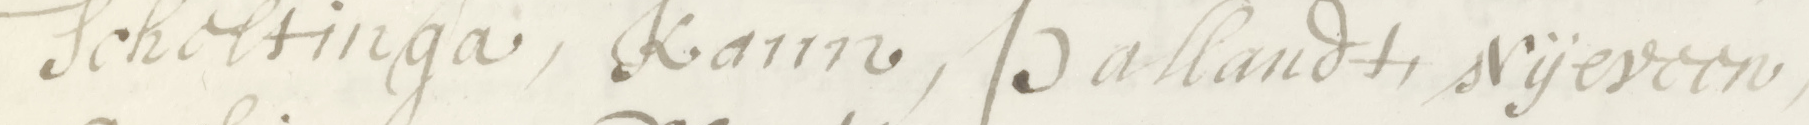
Scheltinga, Kann, Pallandt, Nijeveen,
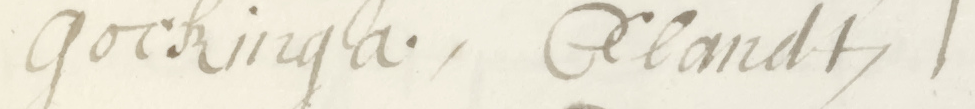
Gockinga, Clandt,
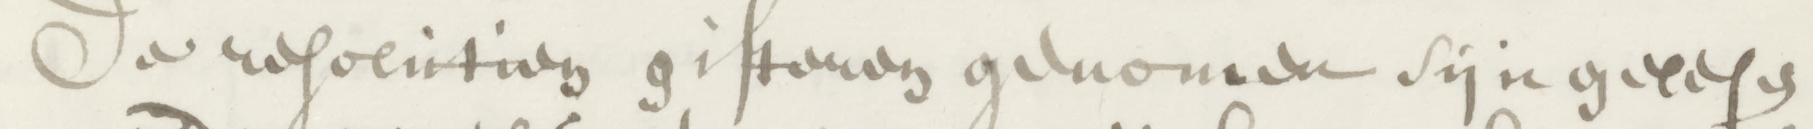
De resolutien gisteren genomen sijn gelesen
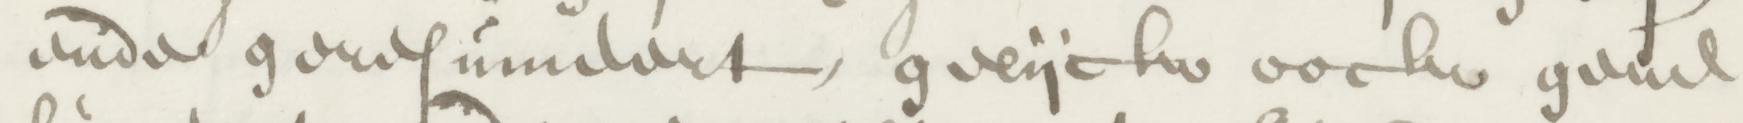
ende geresumeert, gelijck oock gere
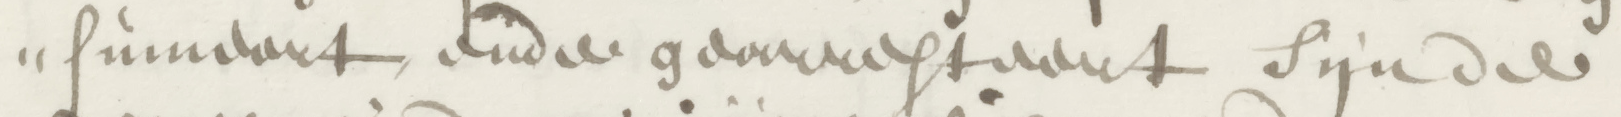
„sumeert, ende gearresteert sijn de
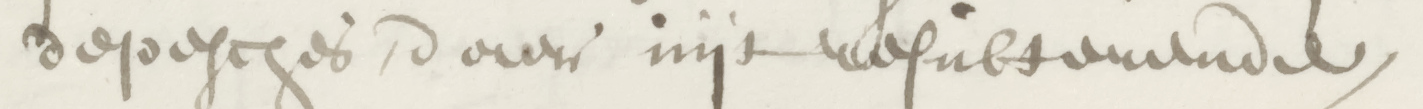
depesches, daer uijt resulterende.
